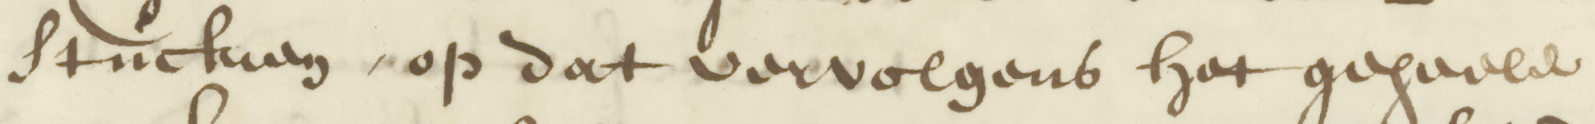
stucken, op dat vervolgens het geheele
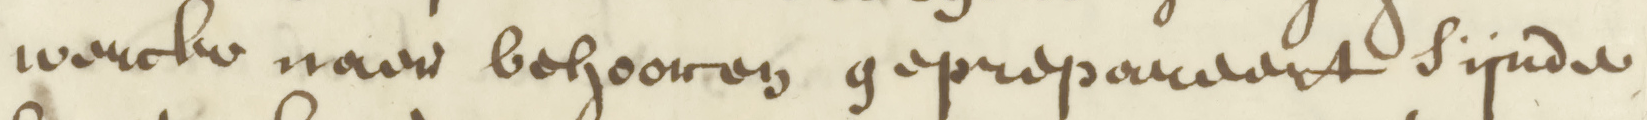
werck naer behooren geprepareert sijnde
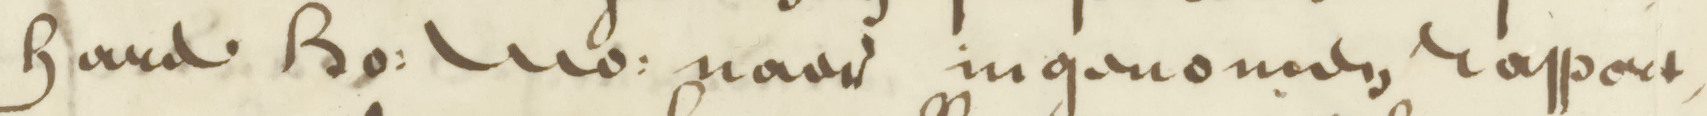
hare Ho:Mo: naer ingenomen rapport
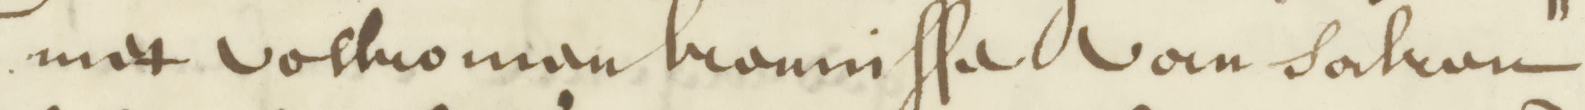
met volkomen kennisse van saken
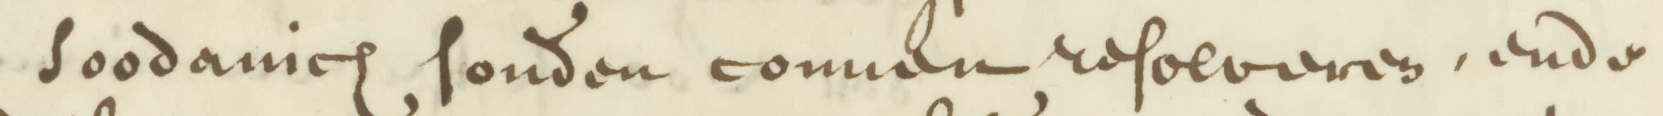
soodanich souden connen resolveren, ende
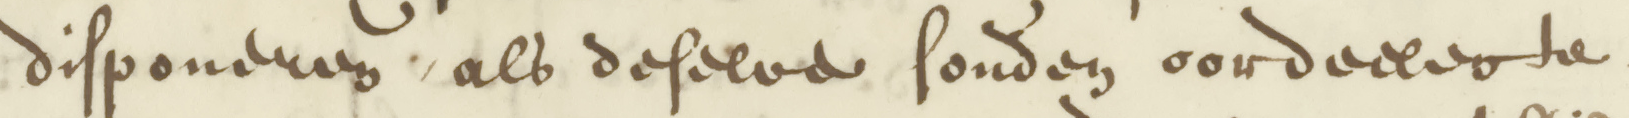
disponeren, als deselve souden oordeelen te
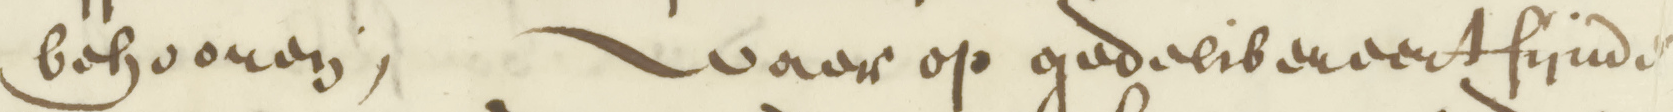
behooren; Waer op gedelibereert sijnde
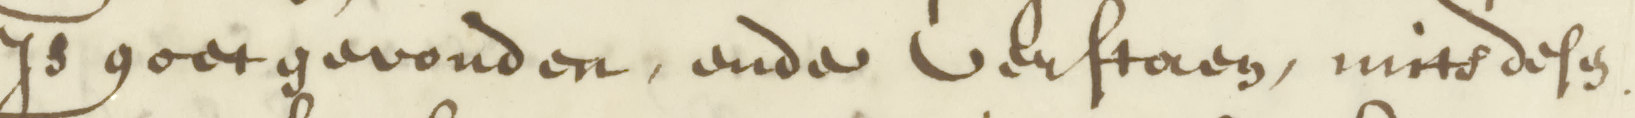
Is goetgevonden, ende verstaen, mits desen
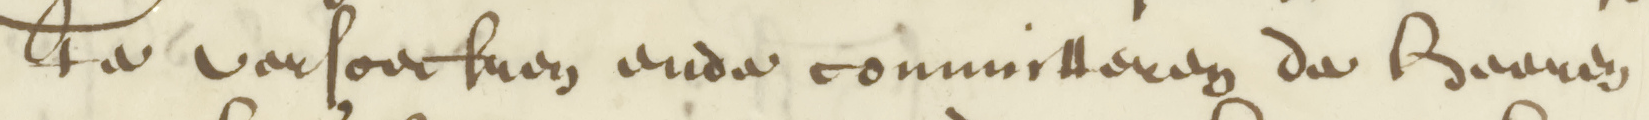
te versoecken ende committeren de Heeren
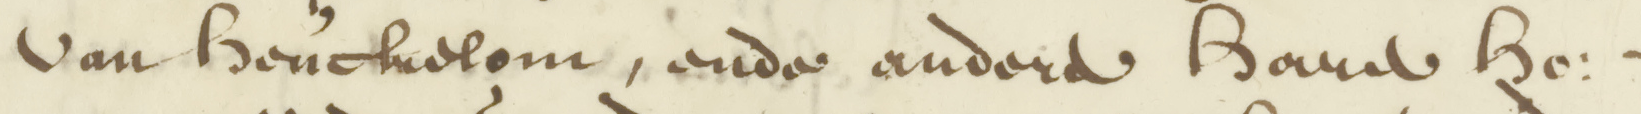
van Heuckelom, ende andere Hare Ho:
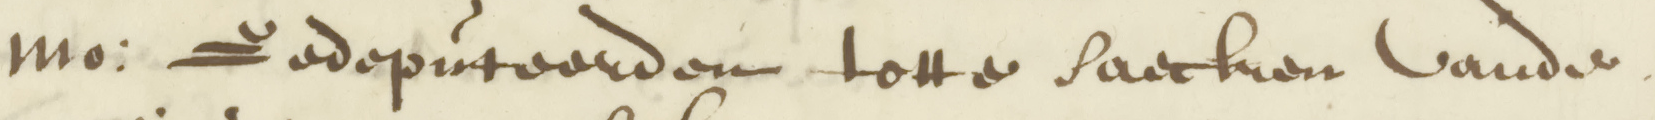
Mo: Gedeputeerden totte saecken vande
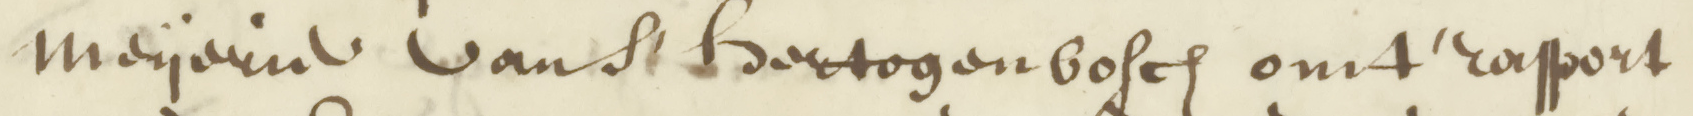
Meijerie van s' Hertogenbosch om t' rapport
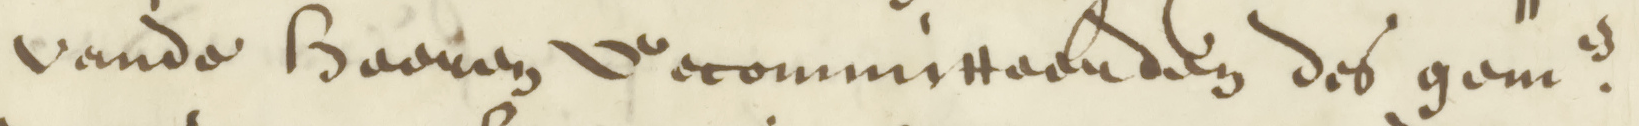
vande Heeren Gecommitteerden des gemen.
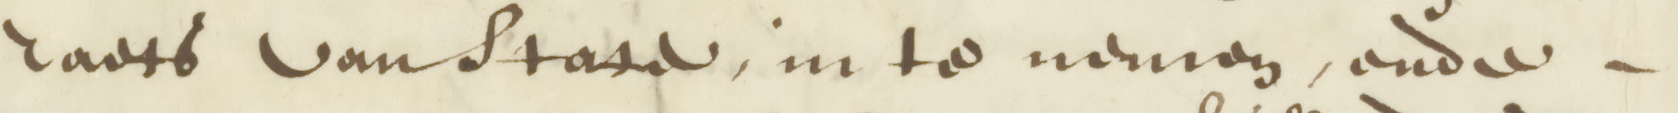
raets van State, in te nemen, ende —
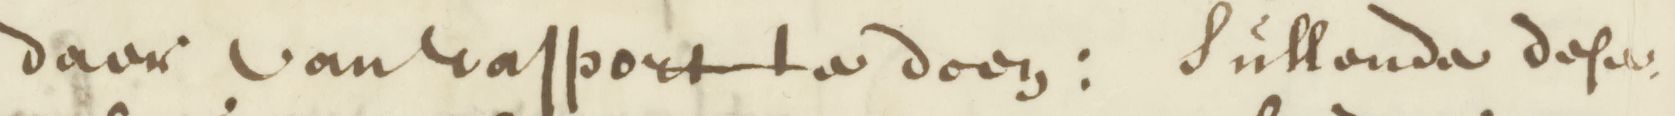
daer van rapport te doen: Sullende dese
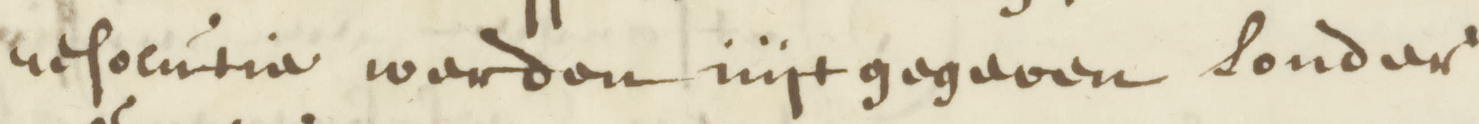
resolutie werden uijtgegeven sonder
